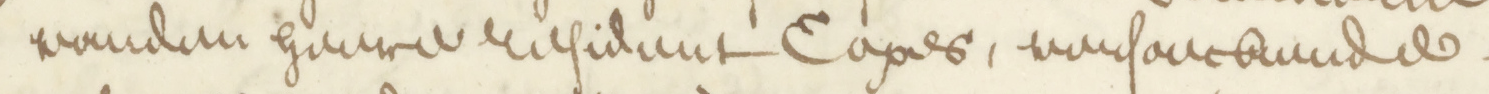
vanden heere resident Copes, versoeckende
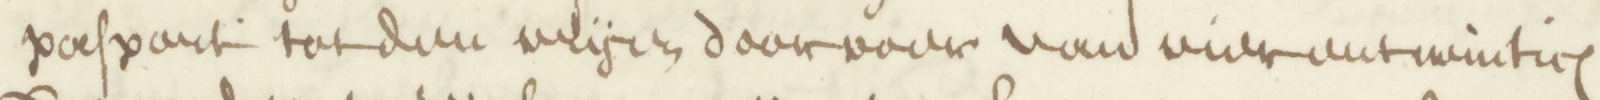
pasport tot den vrijen doorvoer van vierentwintich
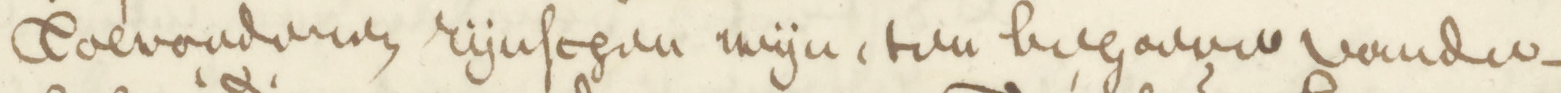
Tolvoederen rijnschen wijn, ten behoeve vande
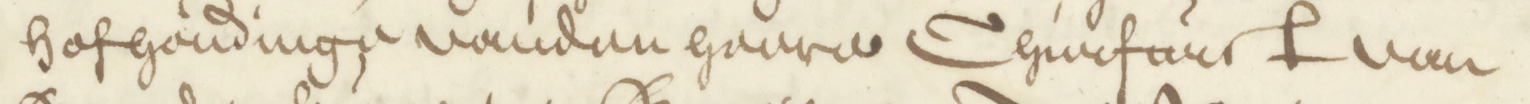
hofhoudinge vanden heere Churfurst van
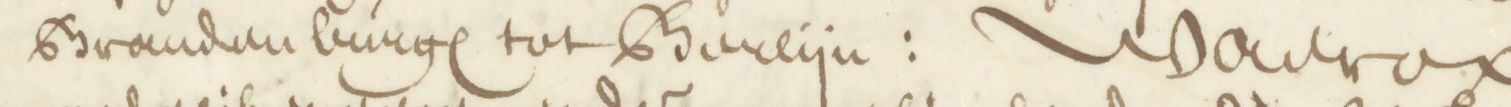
Brandenburgh tot Berlijn: Waerop
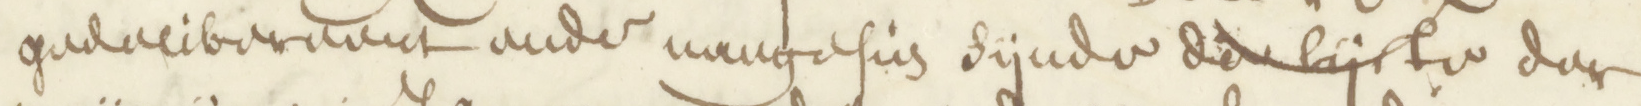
gedelibereert ende naegesien sijnde de lijste der
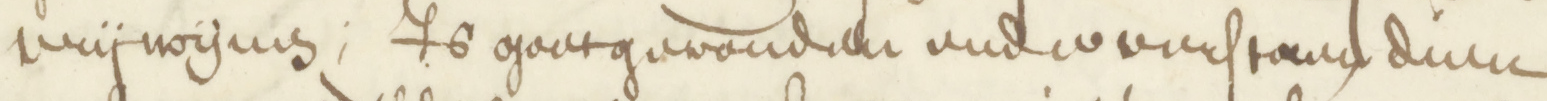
vrijwijnen; Is goetgevonden ende verstaen dien
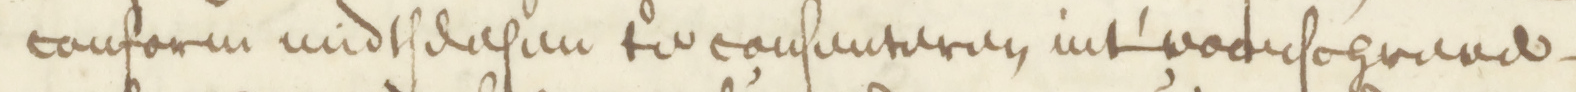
conform midtsdesen te consenteren int‛ voorschreve
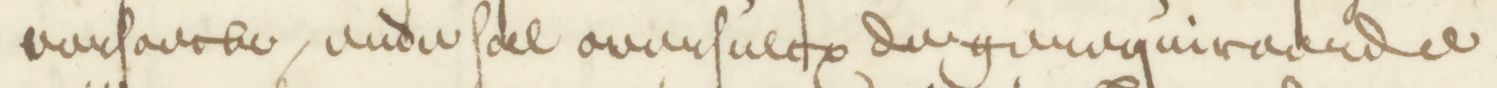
versoeck, ende sal oversulcx de gerequireerde
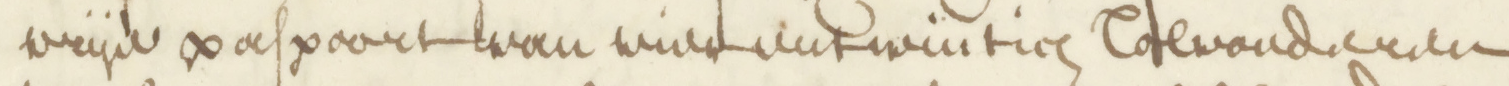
vrije paspoort van vierentwintich Tolvoederen
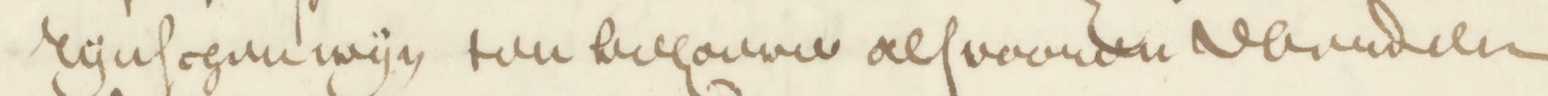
rijnschen wijn ten behoeve alsvooren werden
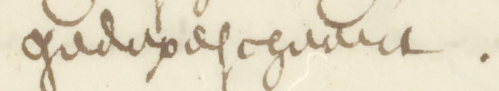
gedepescheert.
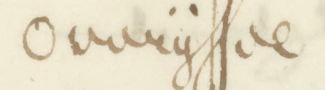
Overijssel
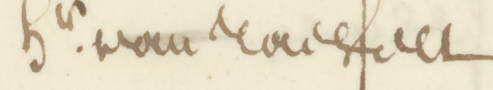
Hr. van Raesfelt
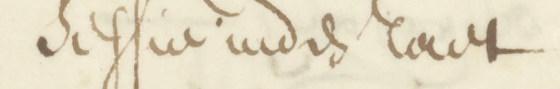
Sessie inden Raet
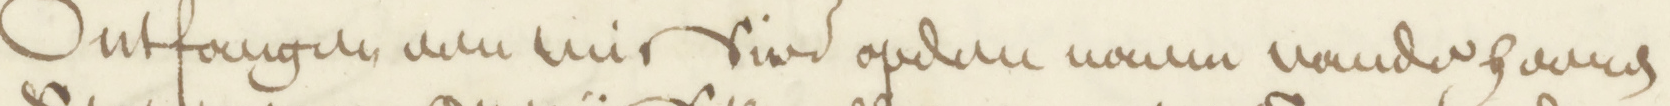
Ontfangen een Missive opden naem vande heeren
